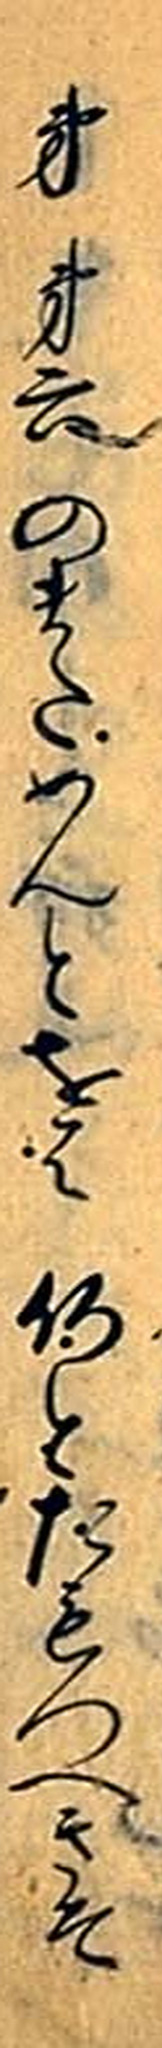弟第六のまためんとをは何とたもつへきそ
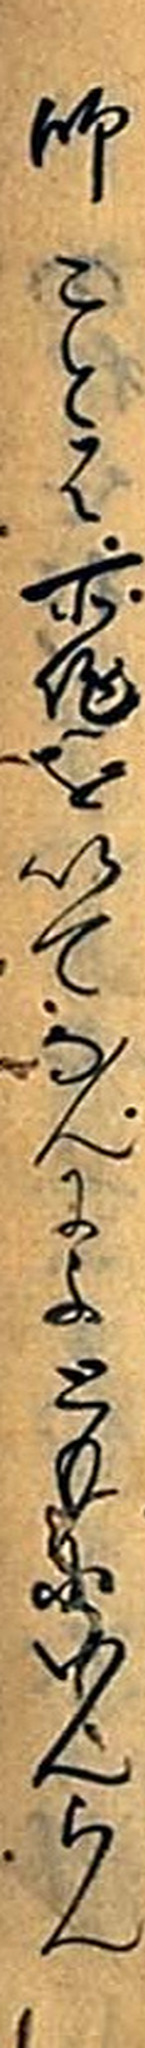師ことは所作を以てなんによともにいんらん

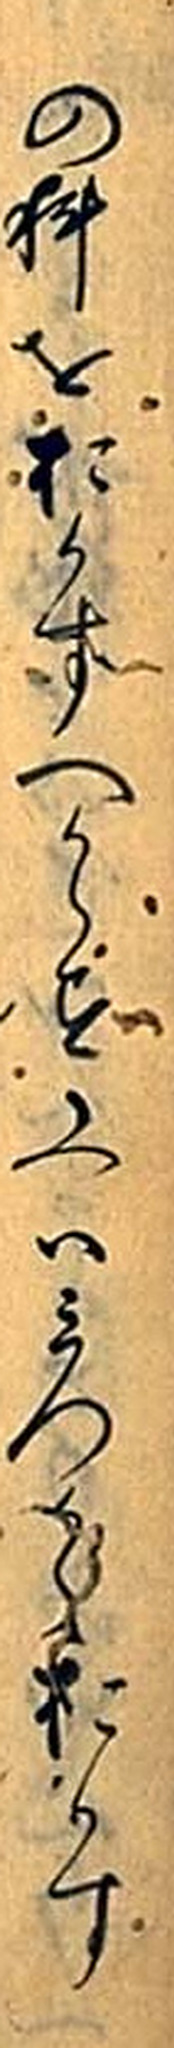の科をおかすへからす又はみつからおかす
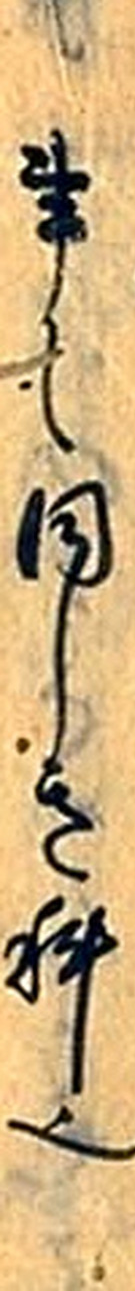事も同しき科也
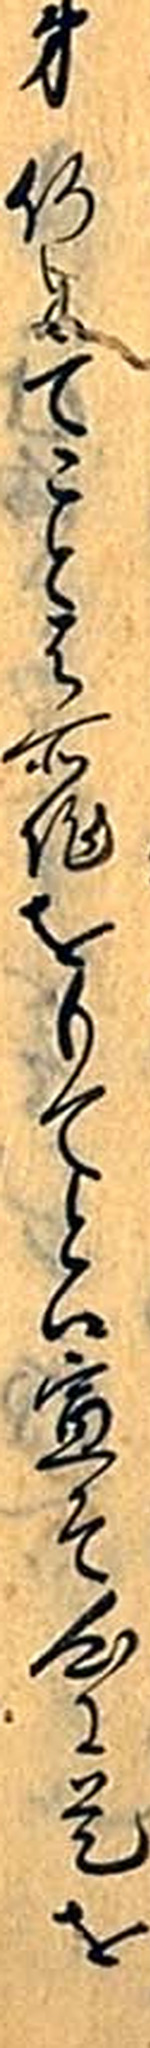弟何てことは所作をもてとは宣そ心に是を
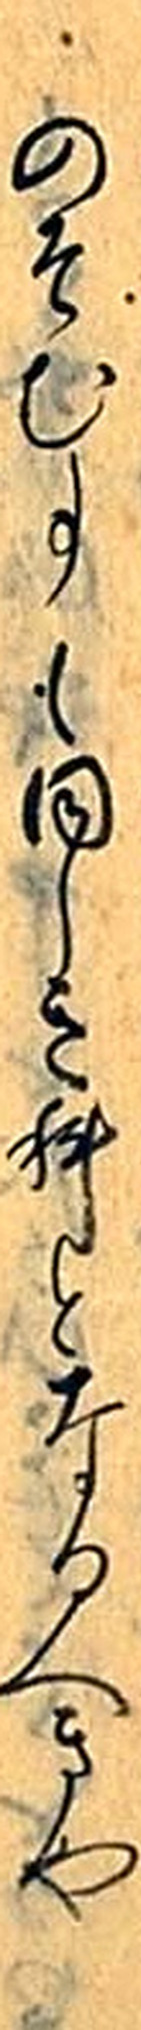のそむ事も同しき科となるへきや
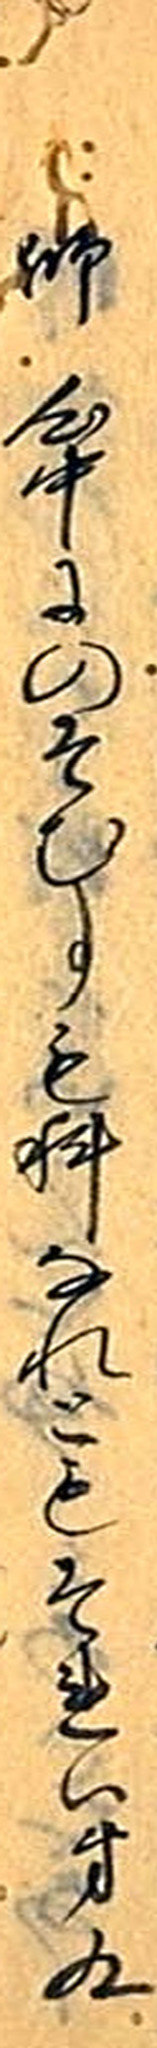師心中にのそむ事も科なれともそれは第九
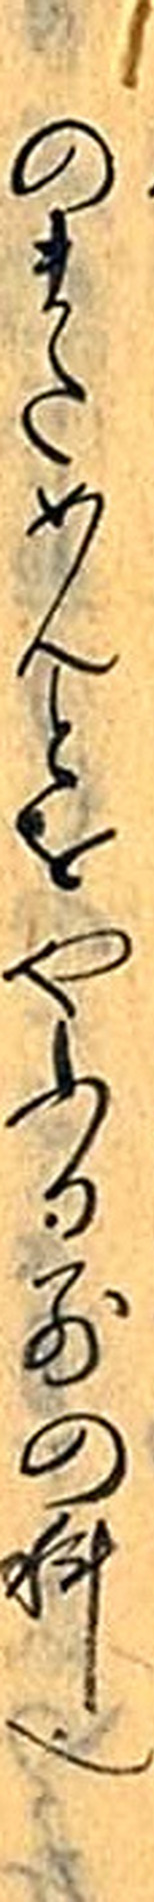のまためんとをやふる別の科也
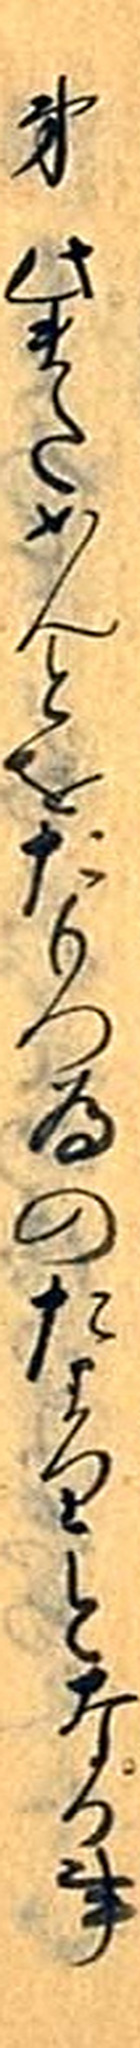弟此まためんとをたもつ為のたよりとなる事
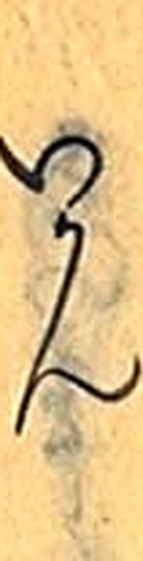いかん
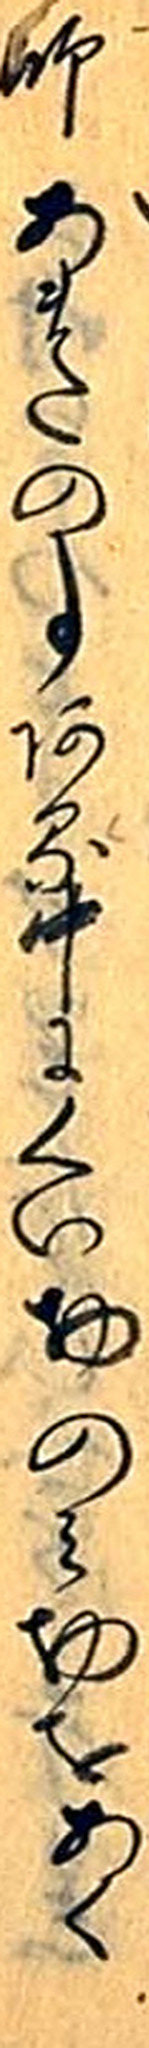師あまたの事ある中にくい物のみ物をあく
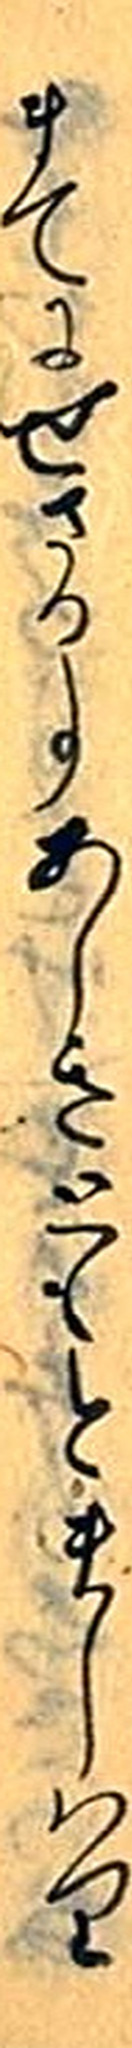まてにせさる事あしきともとましはり
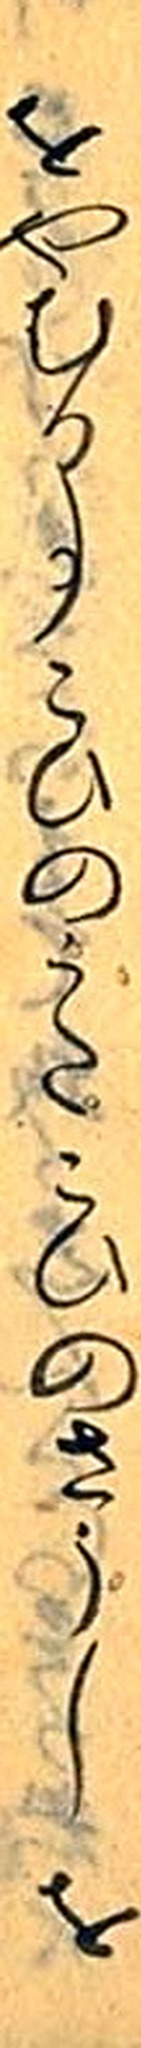をやむる事こひのうたこひのさうしを
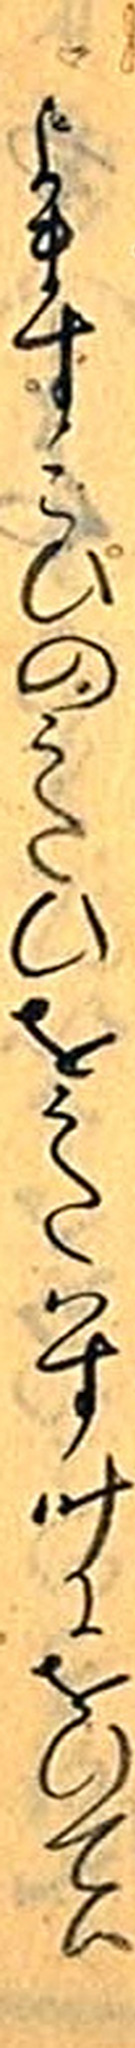よますこひのうたひをうたはす叶にをひては
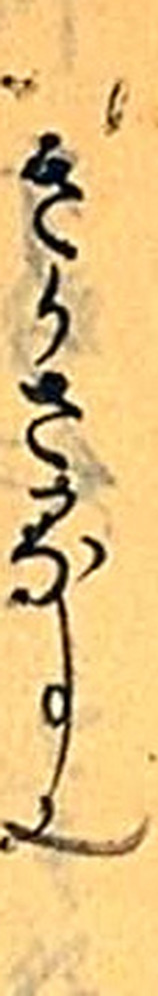きかさる事也
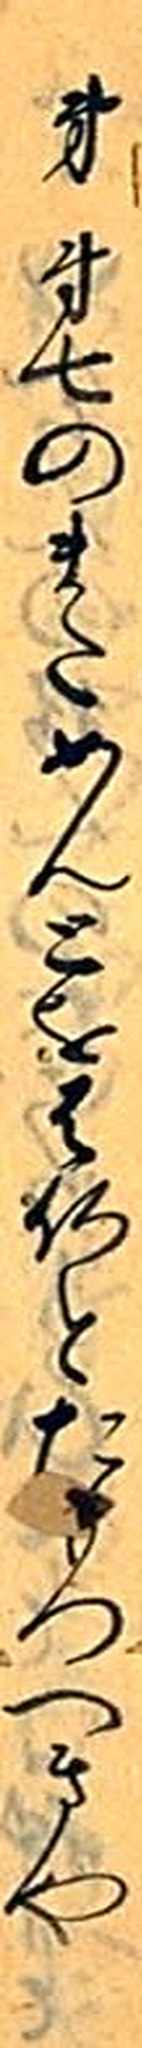弟第七のまためんとをは何とたもつへきや
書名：ドチリナ・キリシタン
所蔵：東京大学総合図書館 / General Library in the University of Tokyo
